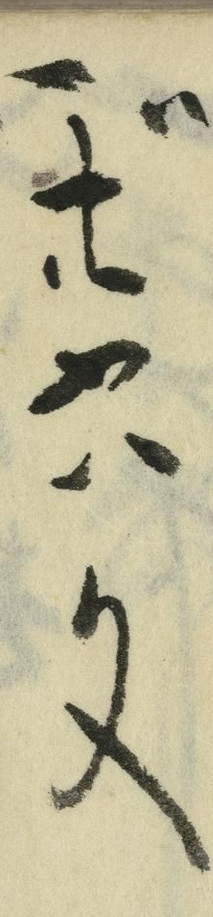一十六文
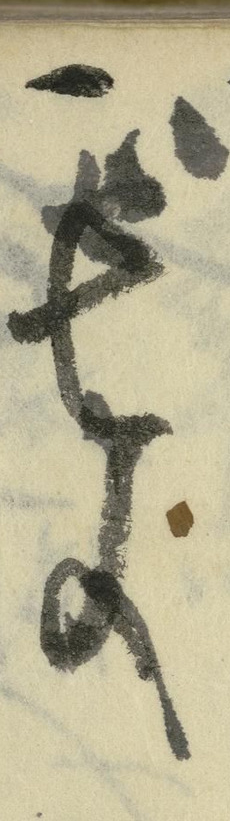同七文

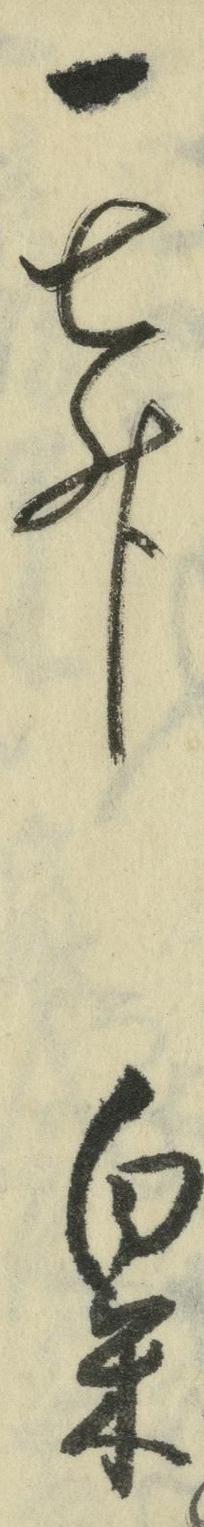一七升白米
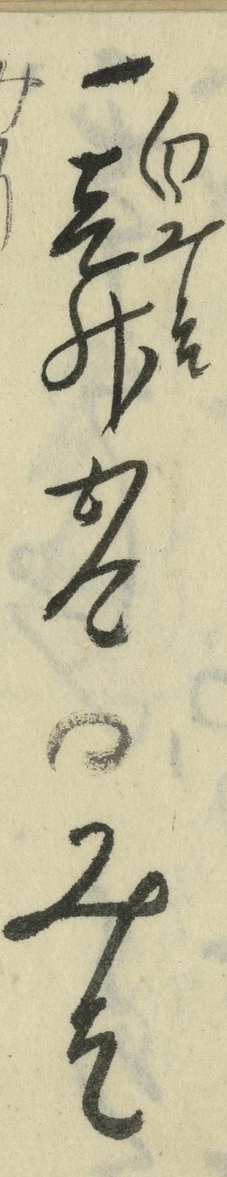一壱升五合みそ
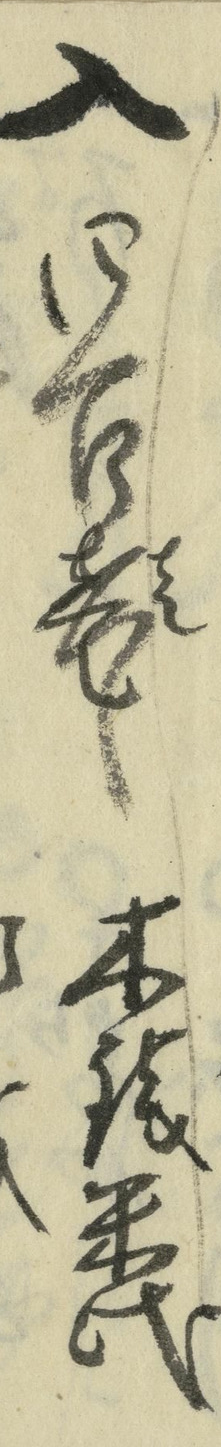入四百壱文木銭米代
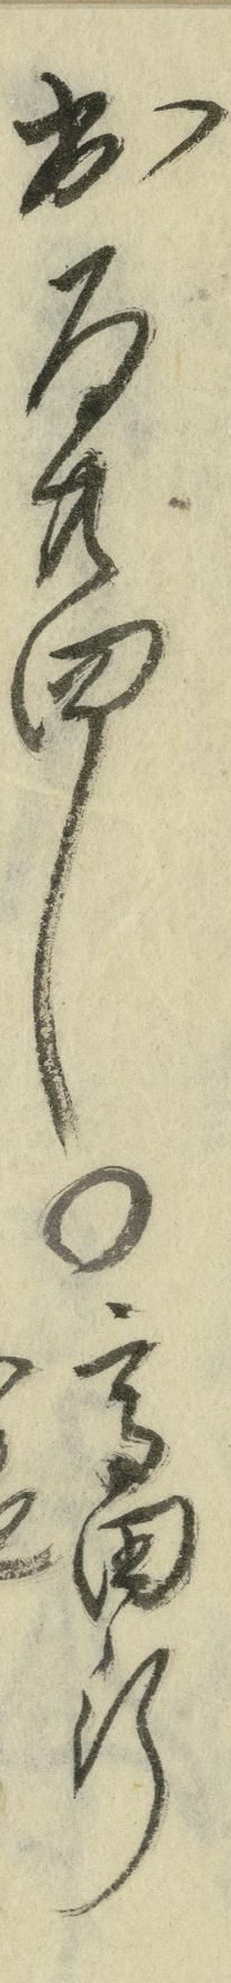出百廿四文高田行
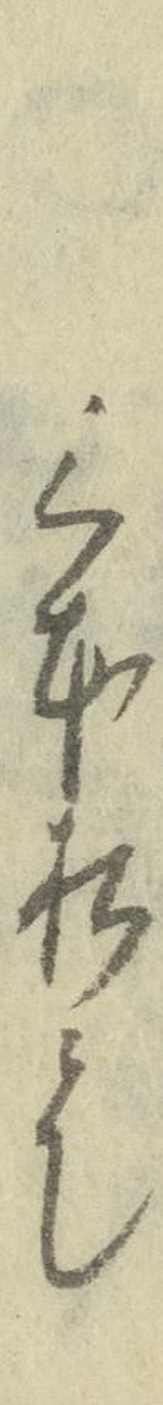三本松にて
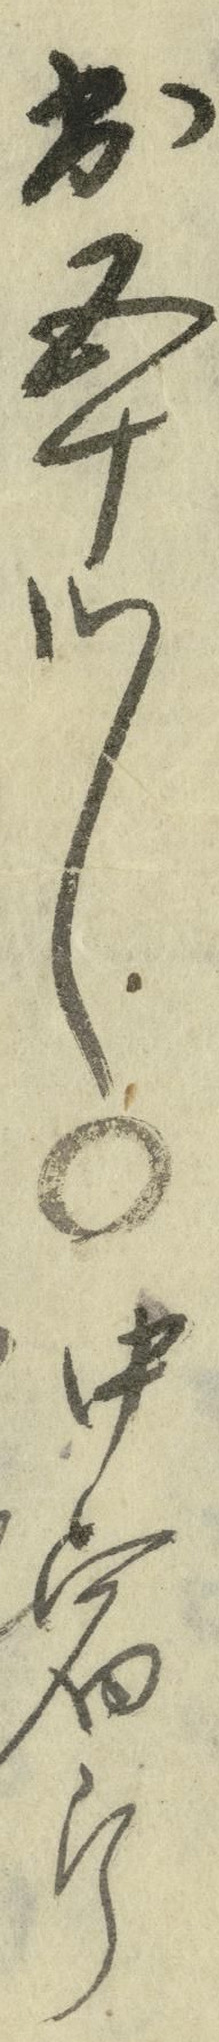出五十弐文中宿行小遣
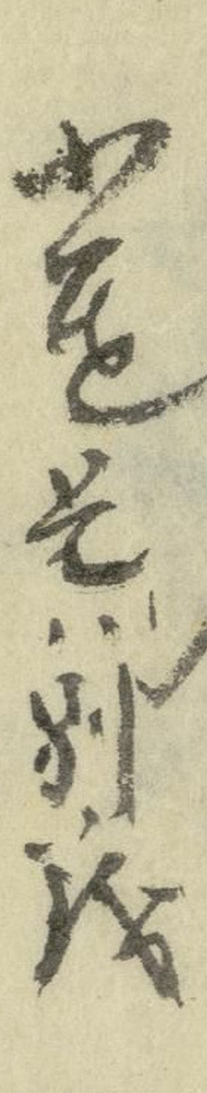小遣是ハ別銭
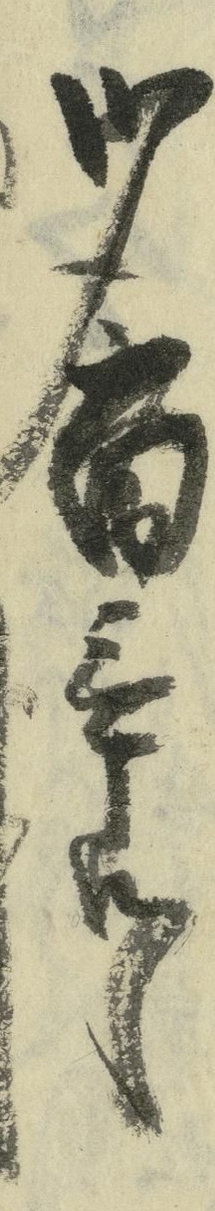弐貫百三十弐文

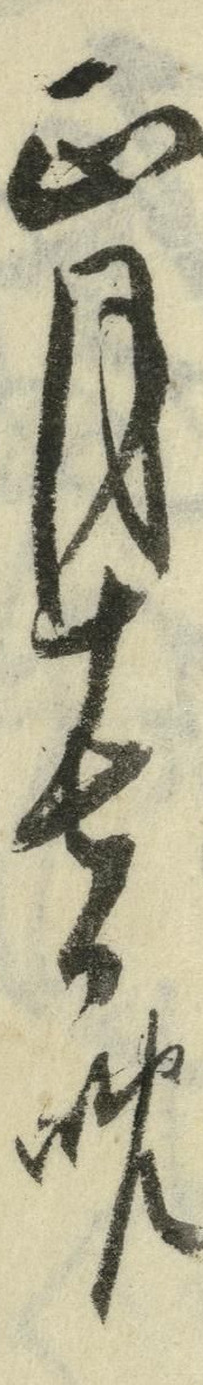正月十七日晩
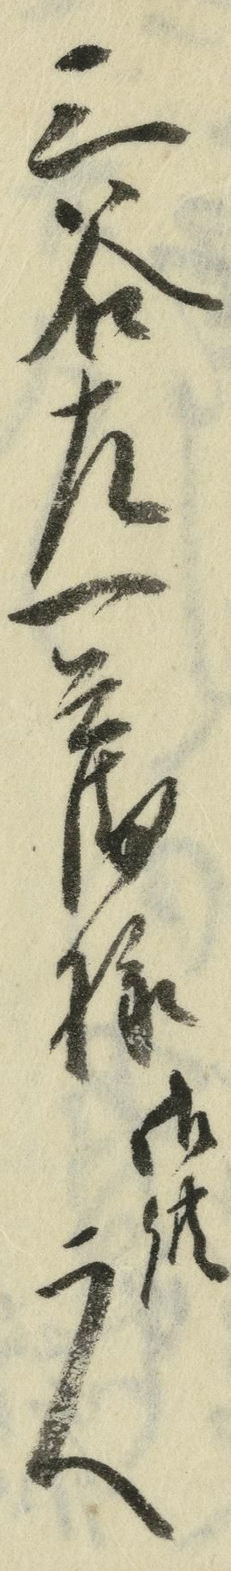三谷左一兵衛様御供二人
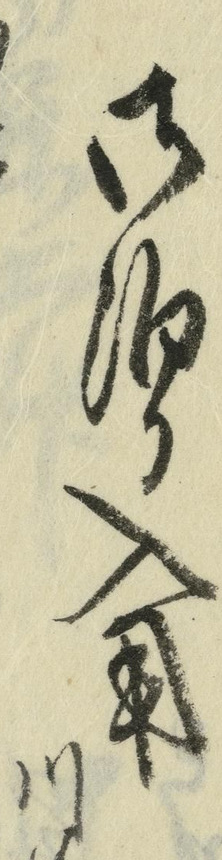御泊り入用
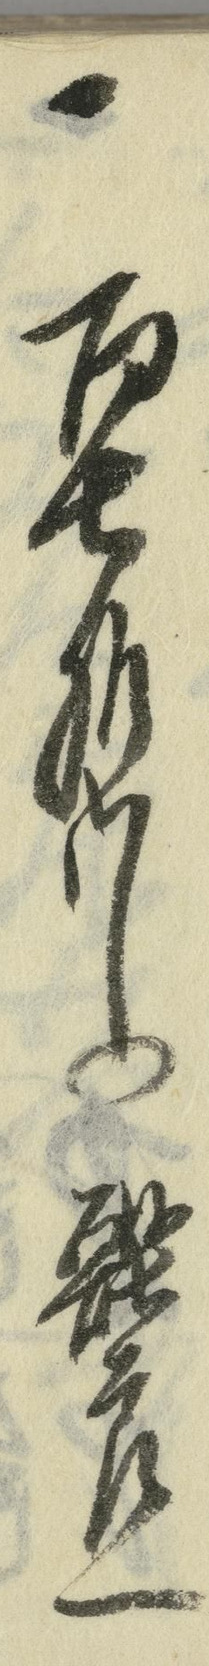一百七拾弐文鰹節一
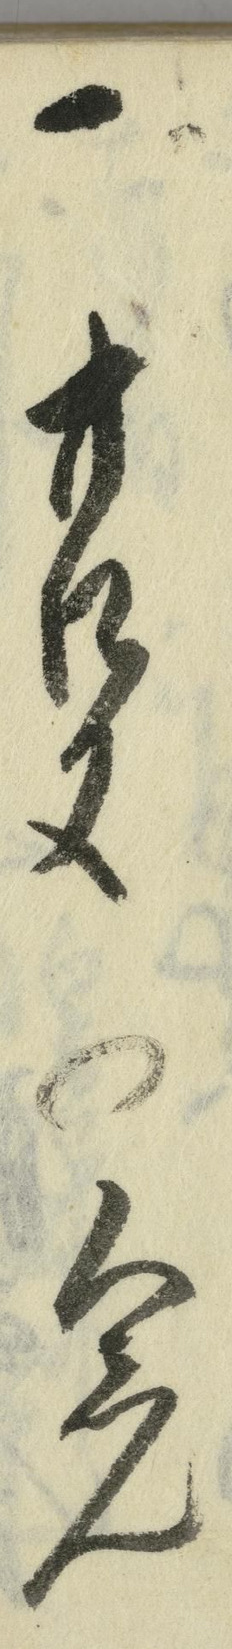一廿四文人しん
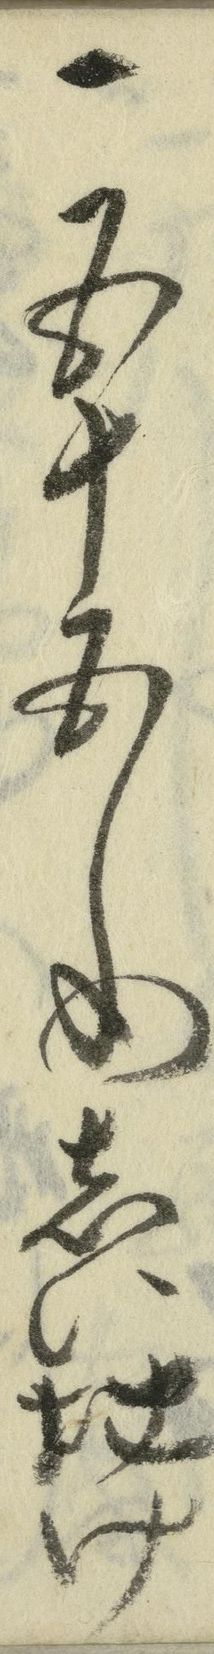一五十五文しいたけ
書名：天明淺間噴火ニ関スル書類
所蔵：東京大学地震研究所図書室 Earthquake Research Institute Library, The University of Tokyo, JAPAN
